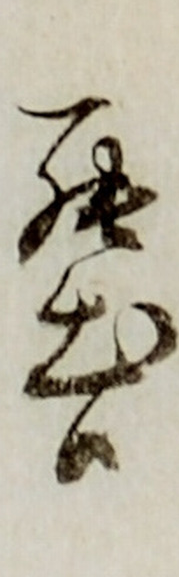罷出候
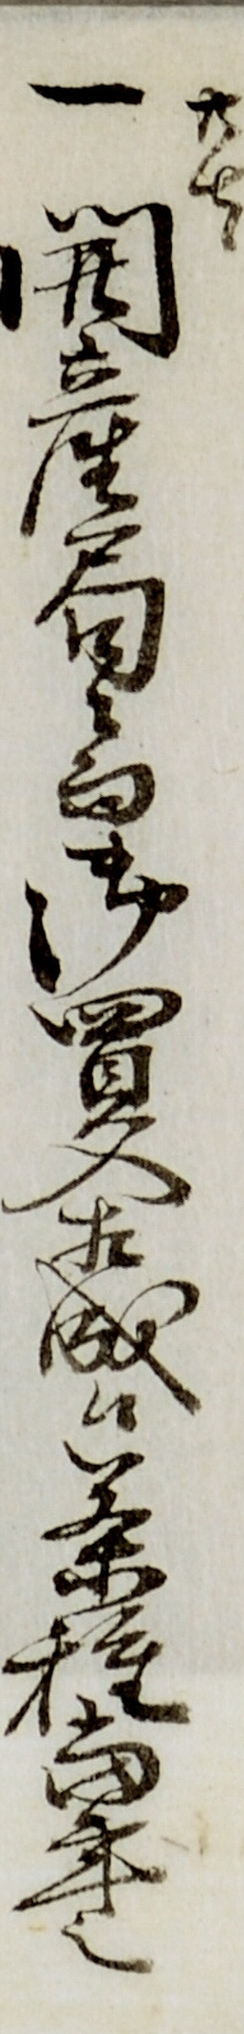一開産局にて御買入相成候茶種当年之
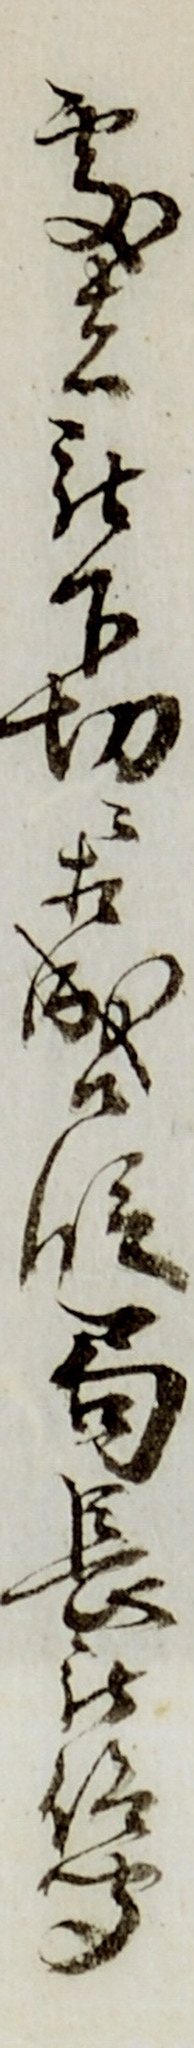処は被下切に相成候段局長被仰聞
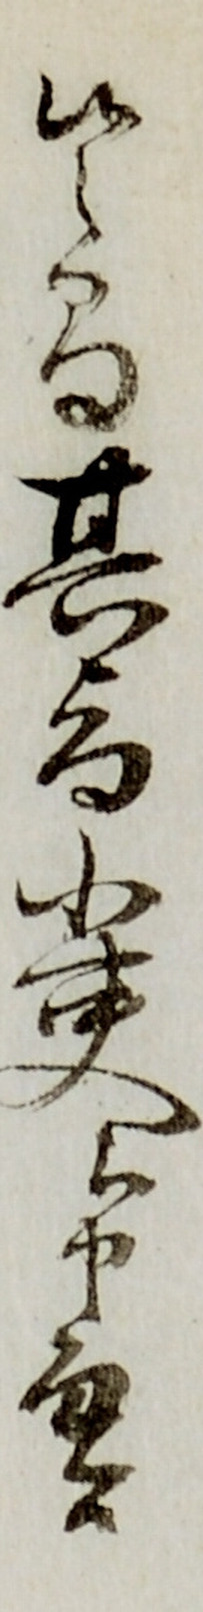候之間其旨小吏え申通候
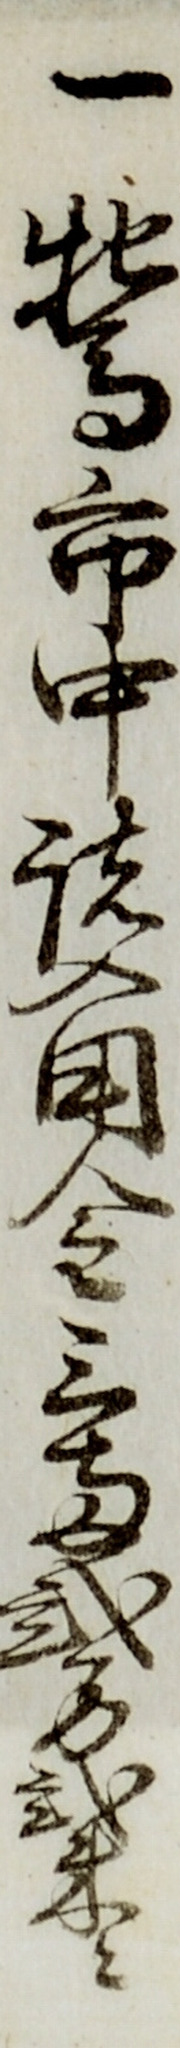一牝馬市中諸入用金三両弐分弐朱と
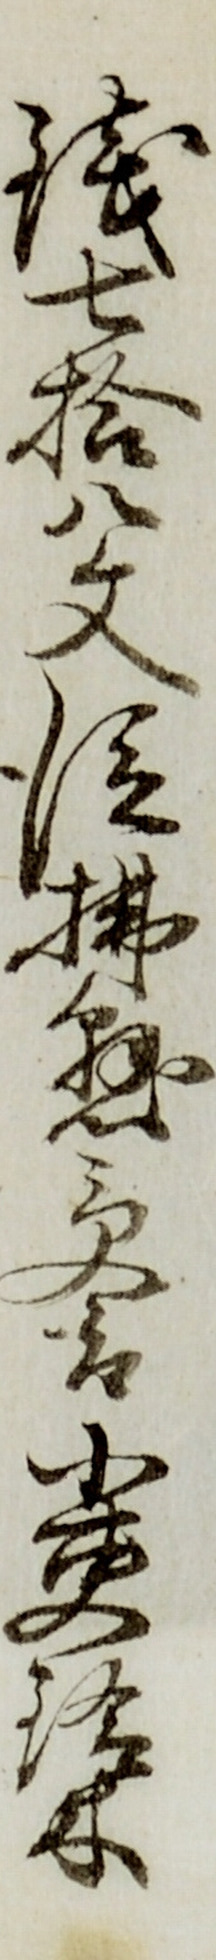銭七拾八文従払懸受取小吏鈴木
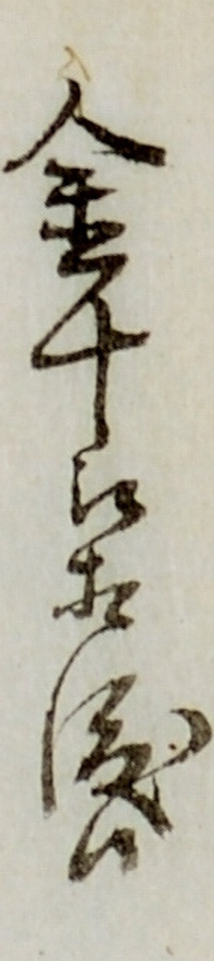金十え相渡候
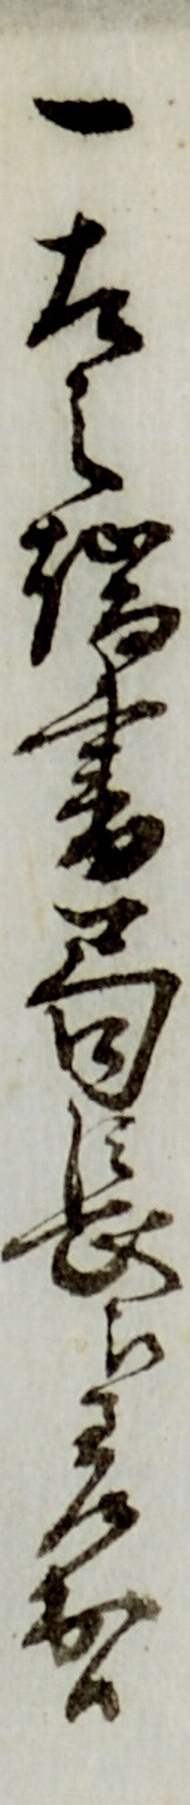一左之端書局長え差出候
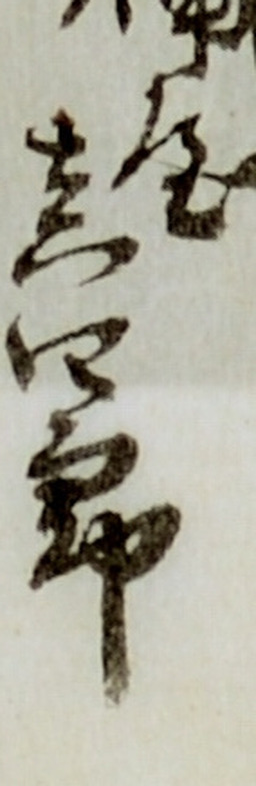真四郎
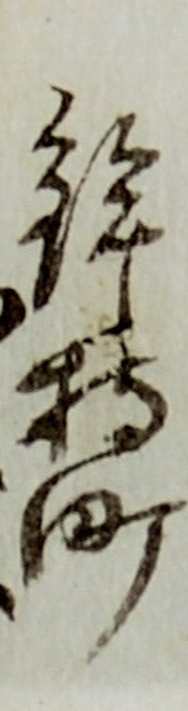鉾持町
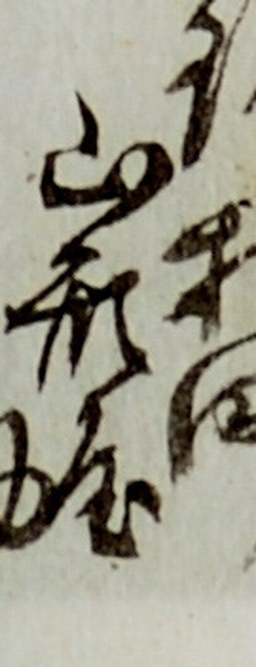山形屋

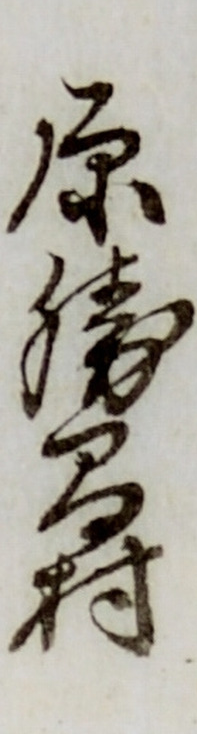原勝間村
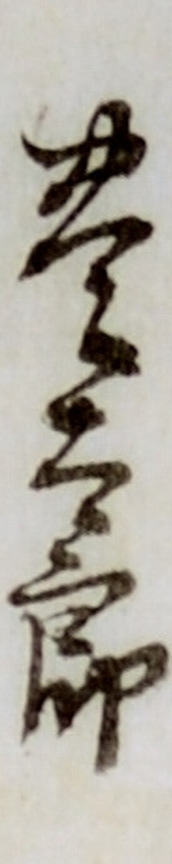豊太郎
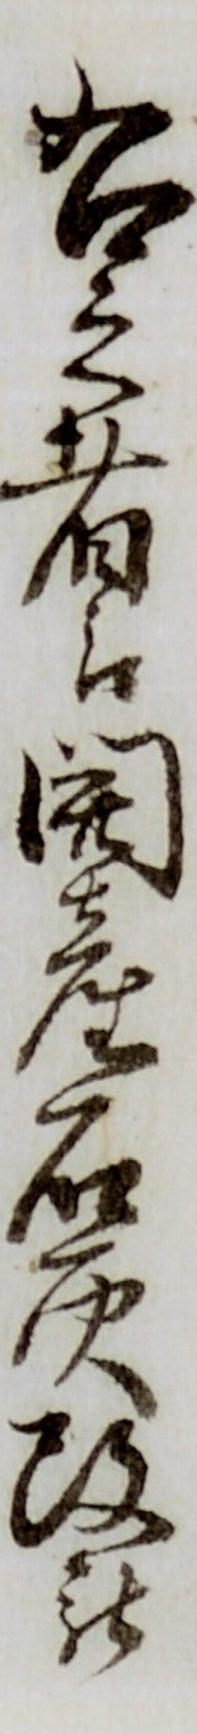右之者え開産石灰改被
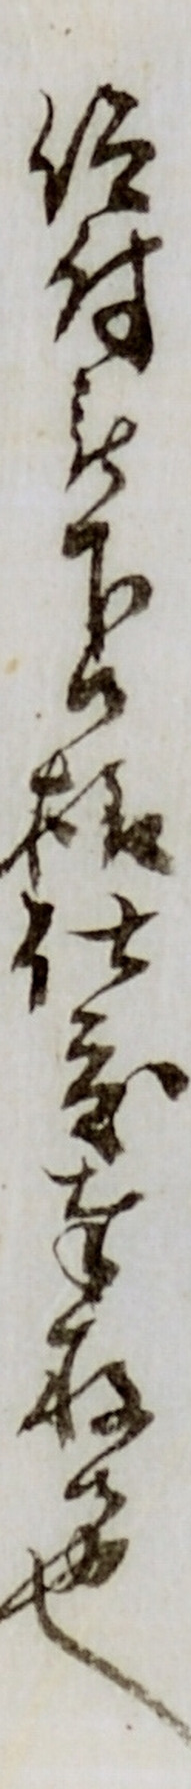仰付被下候様仕度奉存候也
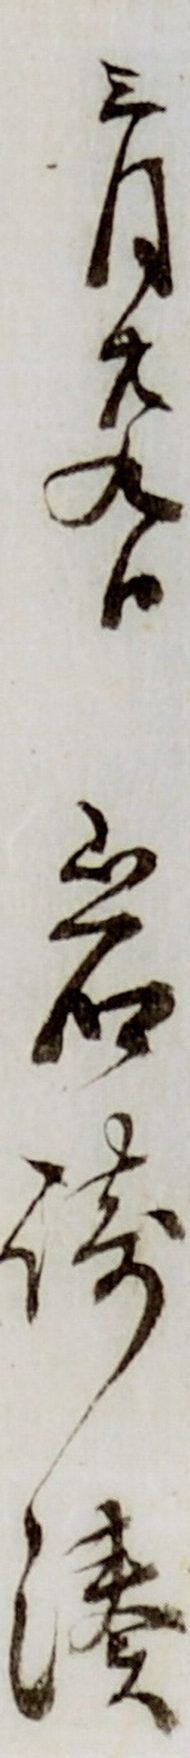三月廿九日岩崎湊
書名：山林方諸事御用留
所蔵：伊那市立高遠町図書館・合同会社AMANE
